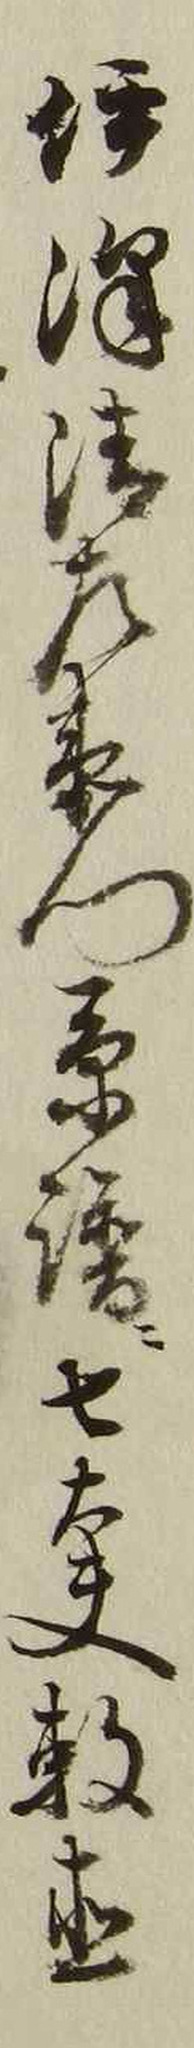伊沢清左衛門系譜ニ七大夫数直
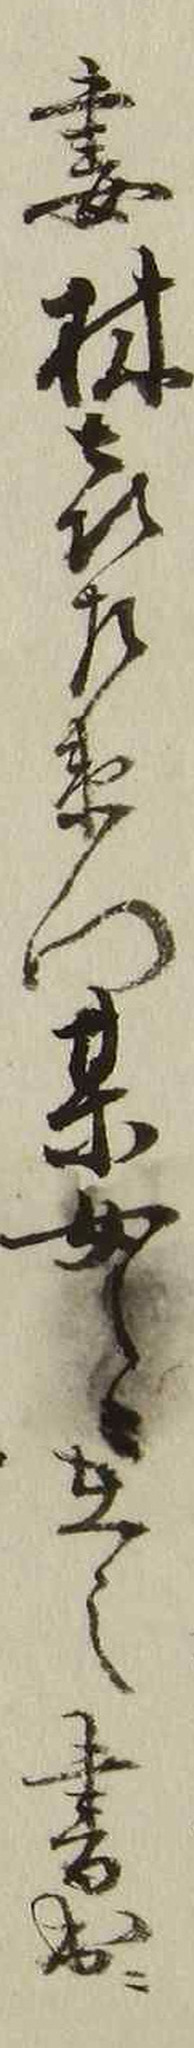妻林喜左衛門某女ニ在之書出ニ
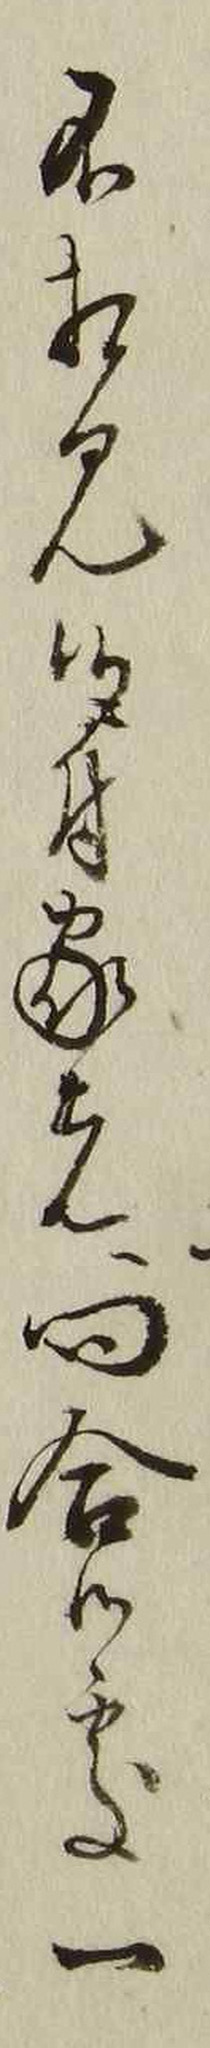不相見候ニ付家先へ問合候処一
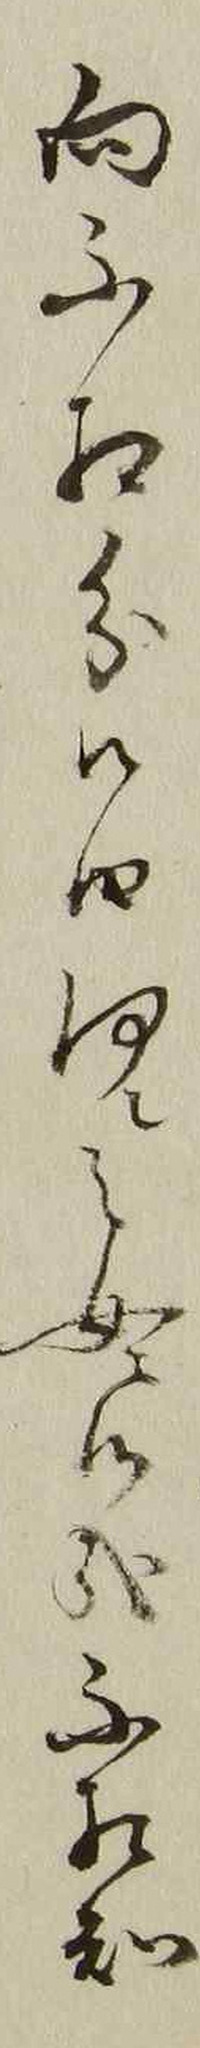向不相分候由何レ之女ニ候哉不相知
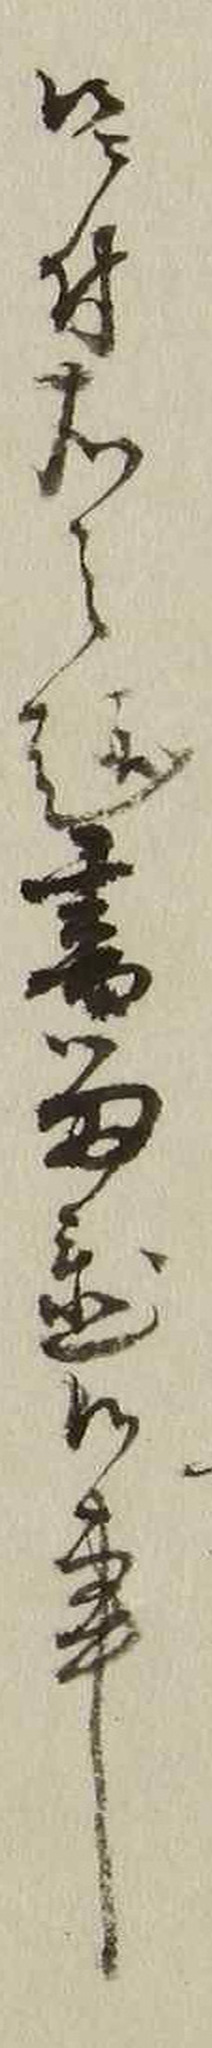候ニ付右之趣書留置候事
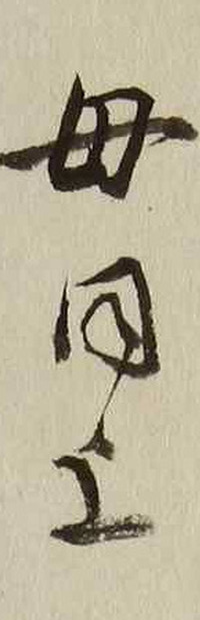母同上
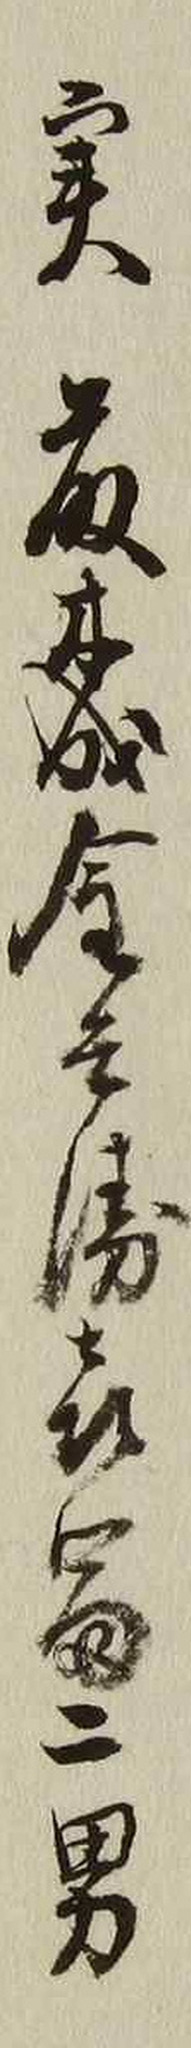実藤森金兵衛喜富二男
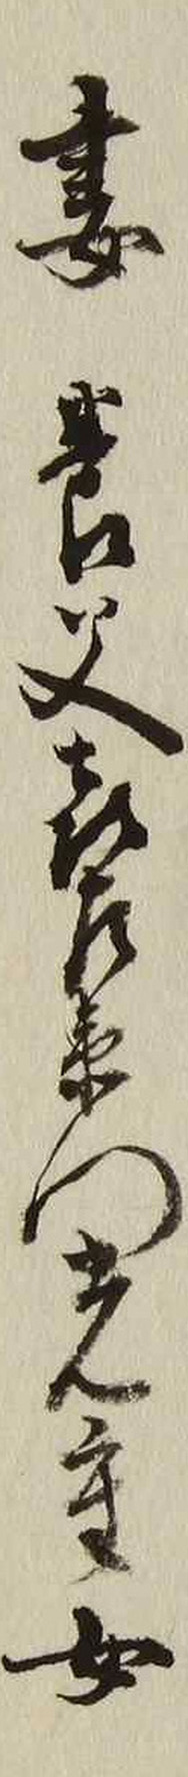妻養父喜左衛門光重女
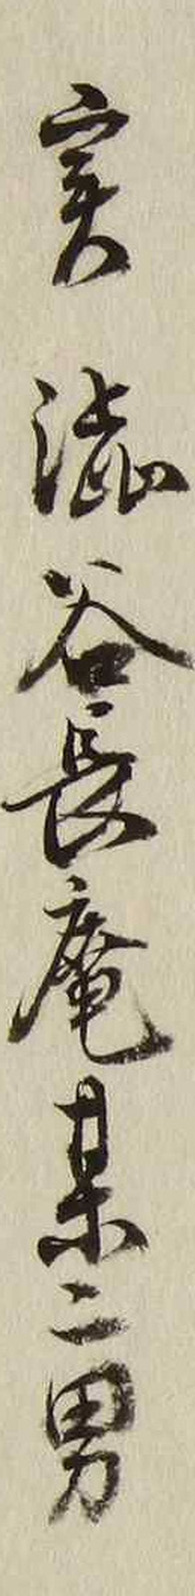実渋谷長庵某二男

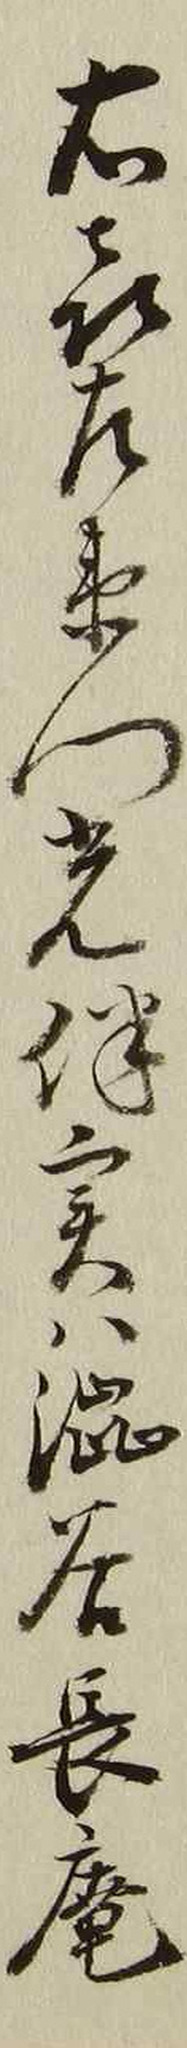右喜左衛門光伴実ハ渋谷長庵
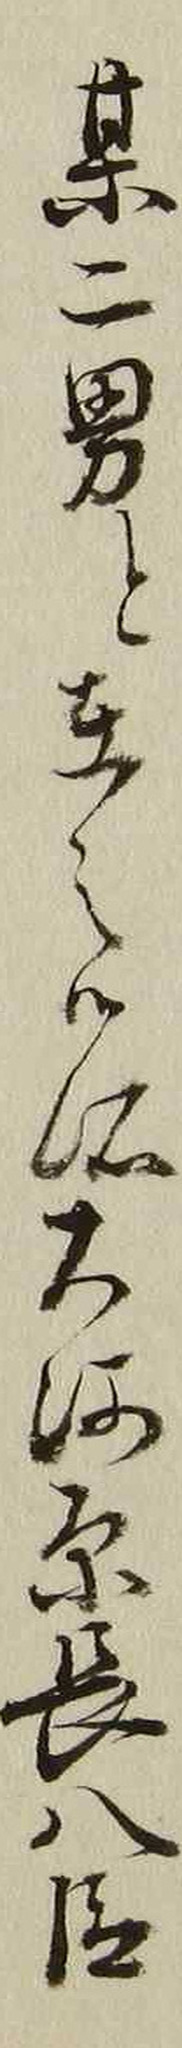某二男と在之候所大河原長八臣
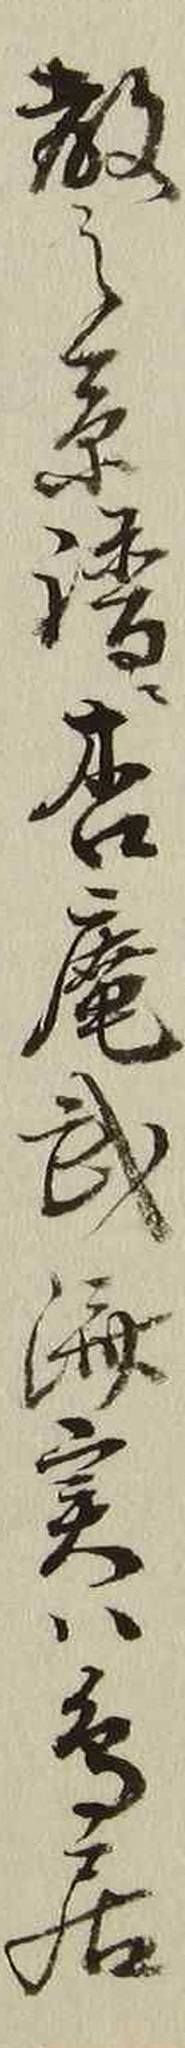教之系譜ニ杏庵武済実ハ鳥居
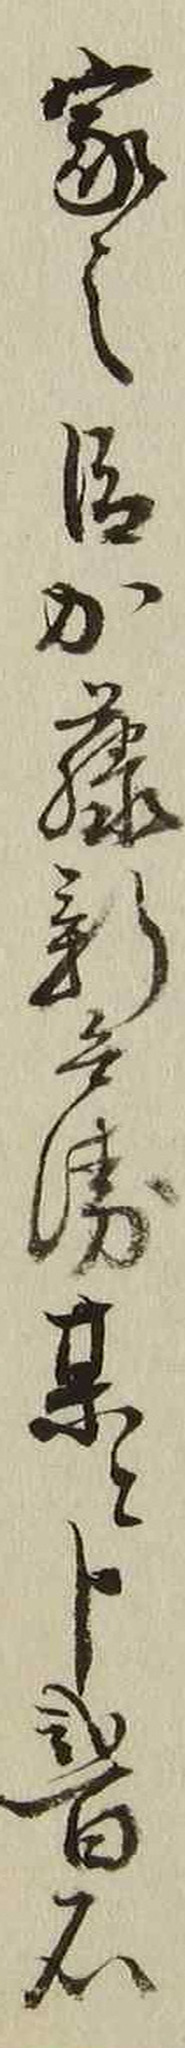家之臣加藤新兵衛某と申弐百石
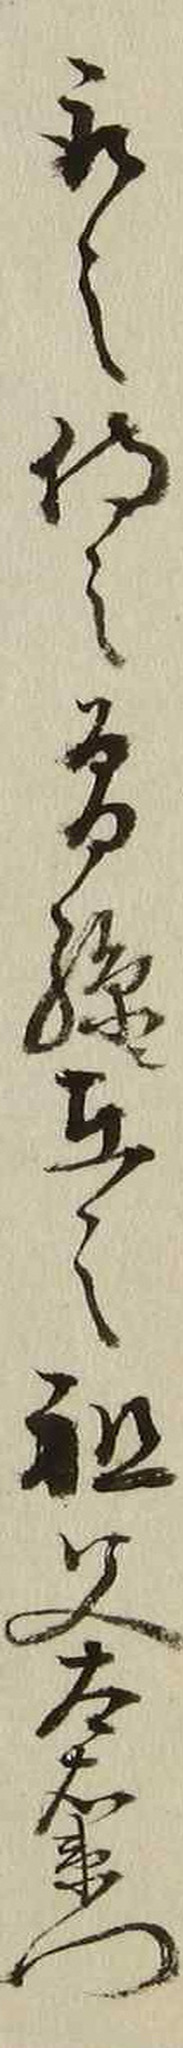取之侍之曾孫ニ在之祖父太右衛門
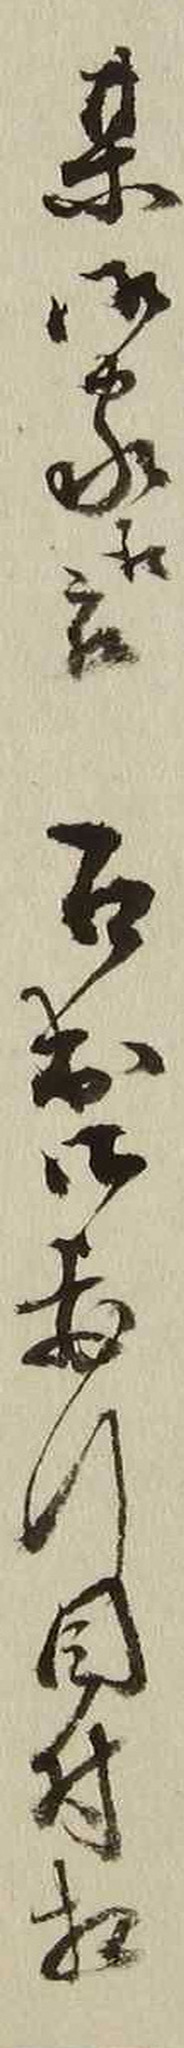某御家江被召出御前行目付相
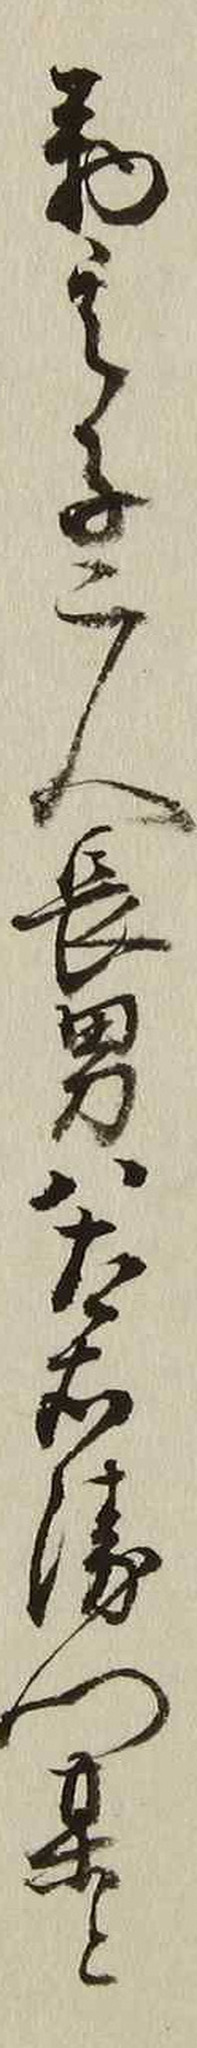勤其子二人長男ハ太右衛門某と
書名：諸士系譜　巻之36　は之部4
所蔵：会津若松市立会津図書館
